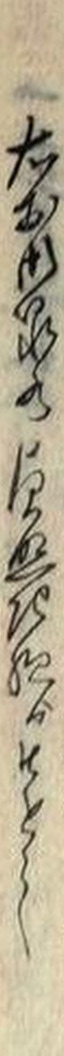右於御泉水貞照院様ゟ被進之
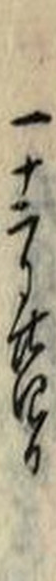一十二月廿四日
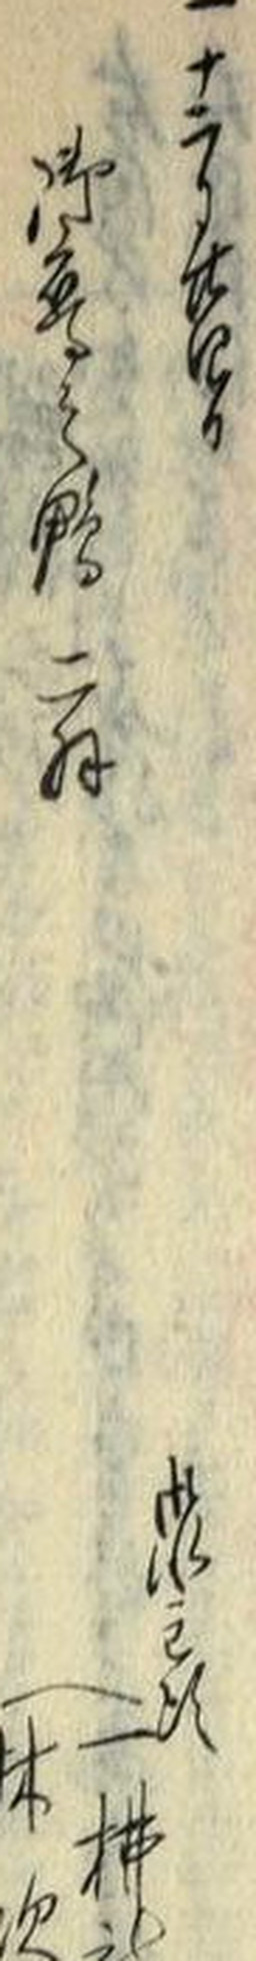御鷹之鴨壱番
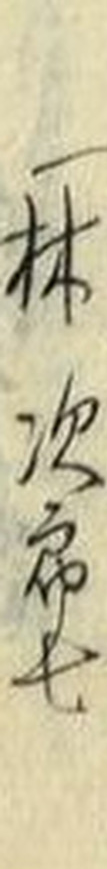林次郎七
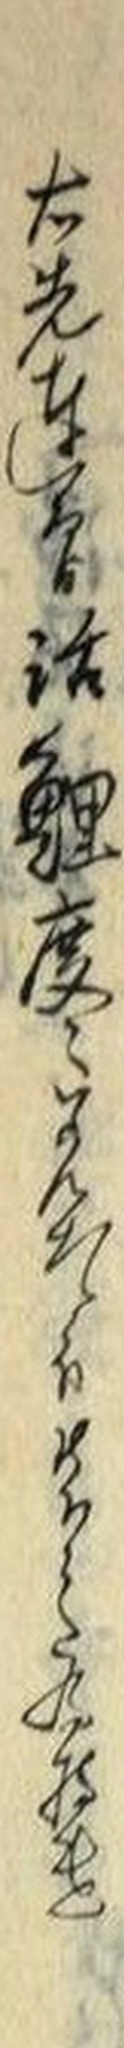右先達而ゟ活鯉度々差出候ニ付被下之為持遣

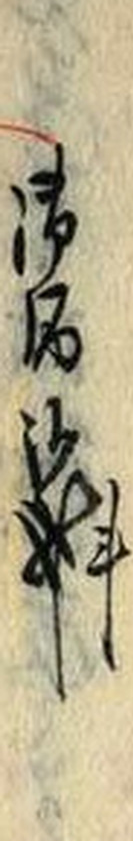御酒弐斗
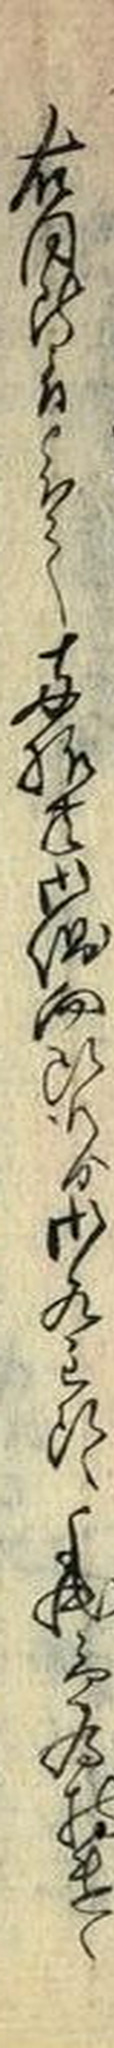右同断ニ付被下之両様共御側向頭取ゟ御水主頭へ手紙ニ而為持遣候
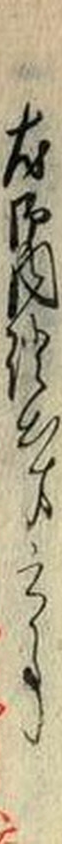尤御内証出方之事
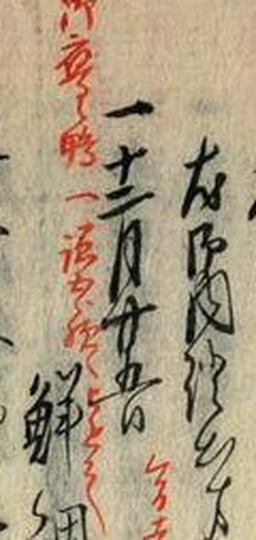一十二月廿五日
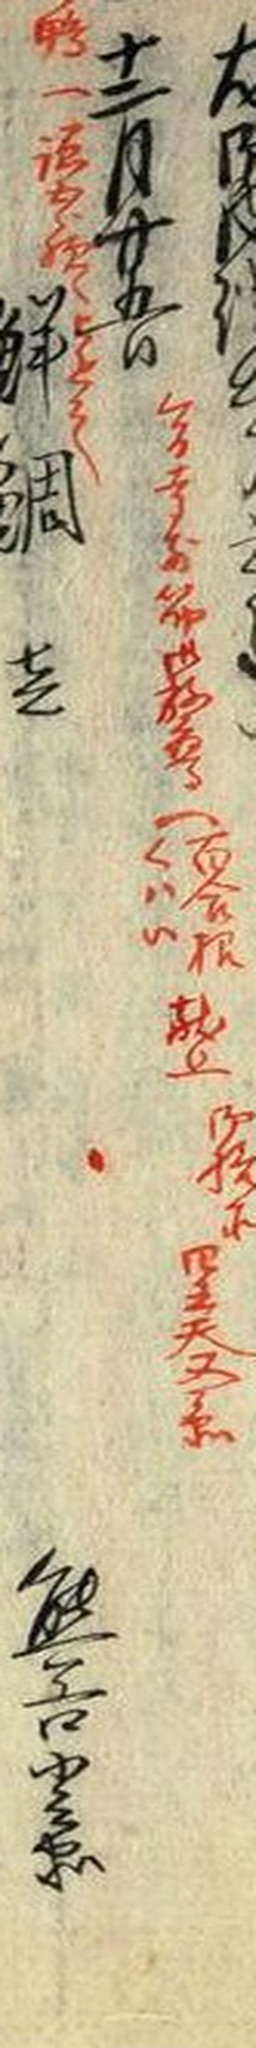鮮鯛壱熊谷小兵衛
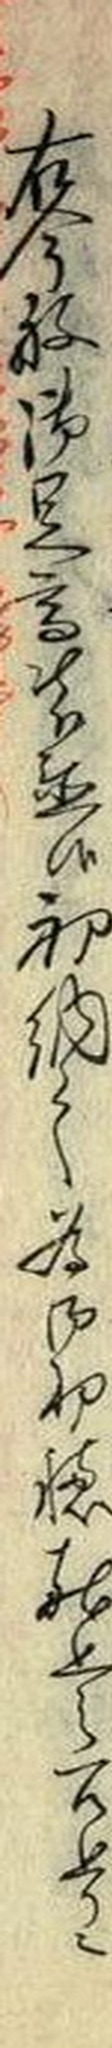右今般御足高被下置候初納之為御初穂献上之召上りニ
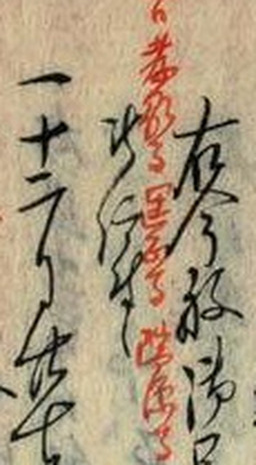被仰付候
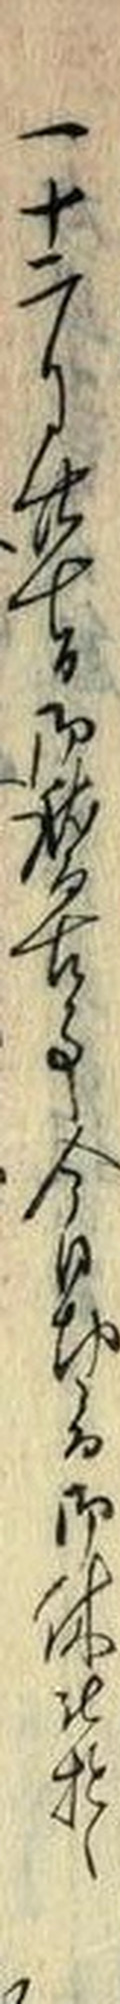一十二月廿七日御稽古事今日切ニ而御休被遊候
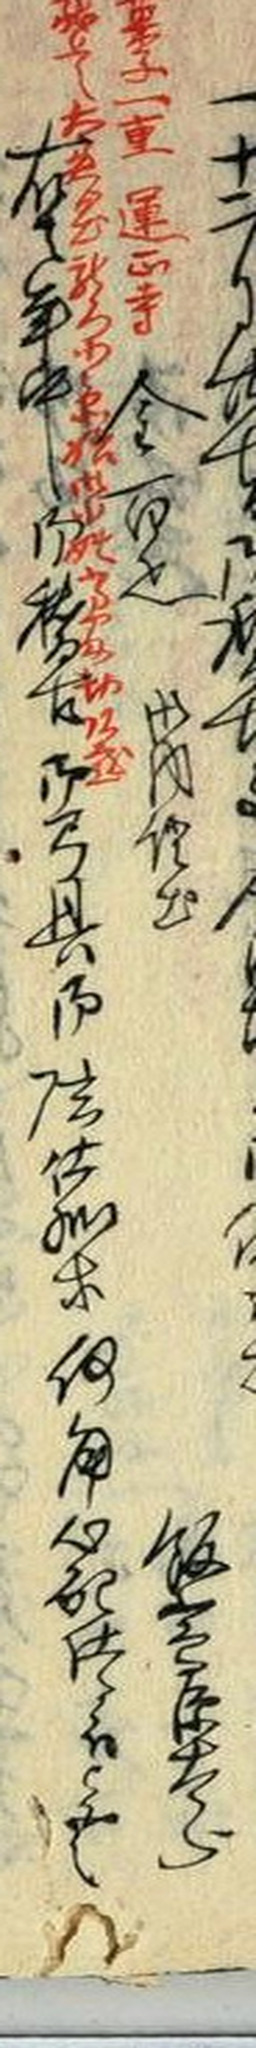右者年中御稽古御弓具御弦仕掛等何角心配仕候ニ付被下之
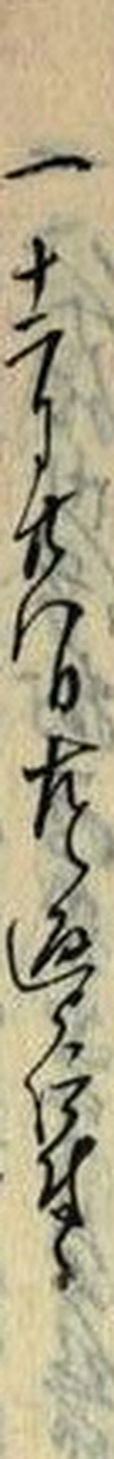一十二月廿八日左之通被仰付候
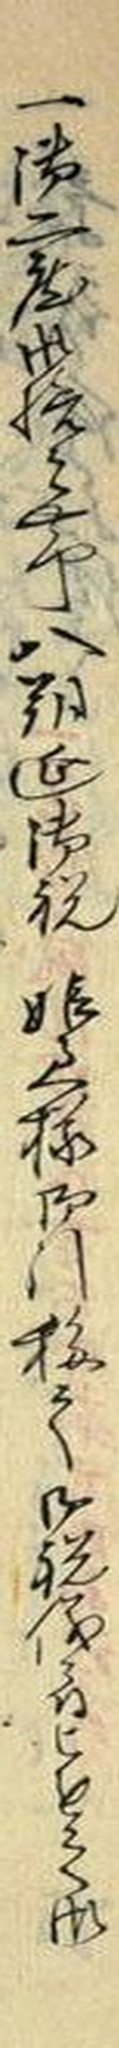一御二度御膳之節八朔延御祝姫君様御引移之御祝儀ニ付被進之御
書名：少傅日録抄（斉承付側向頭取日記、在国）
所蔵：福井県文書館 Fukui Prefectural Archives
